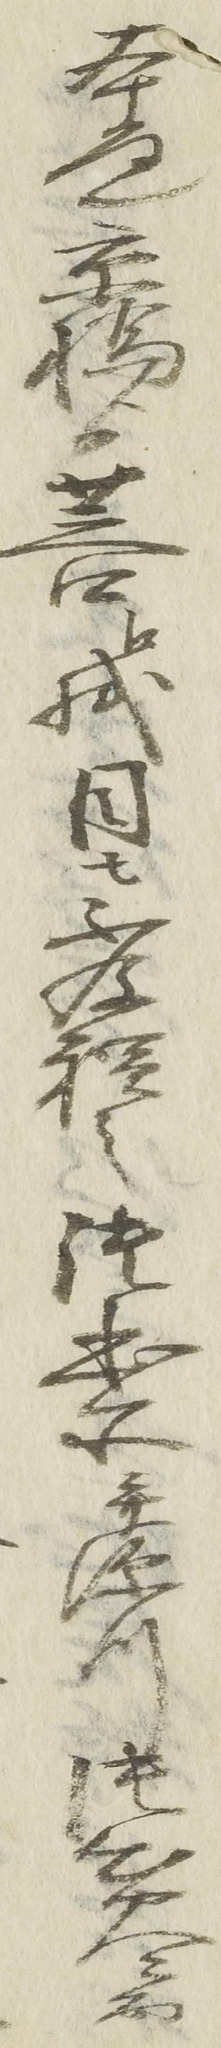本通京橋ゟ芝口江掛目も不及程之潰本所幷深川潰出火二而
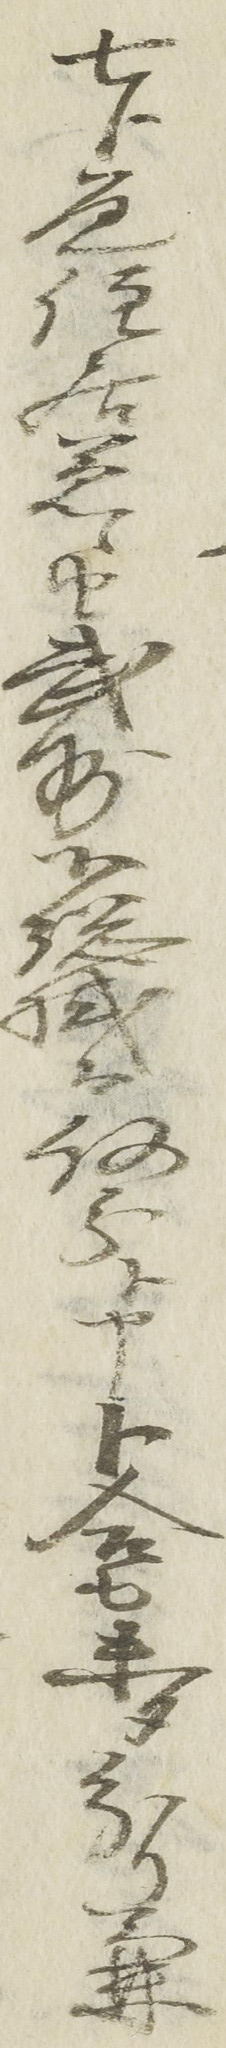七分通住居兼候由武州下総掛而何分ト申候ト合も未タ分リ兼
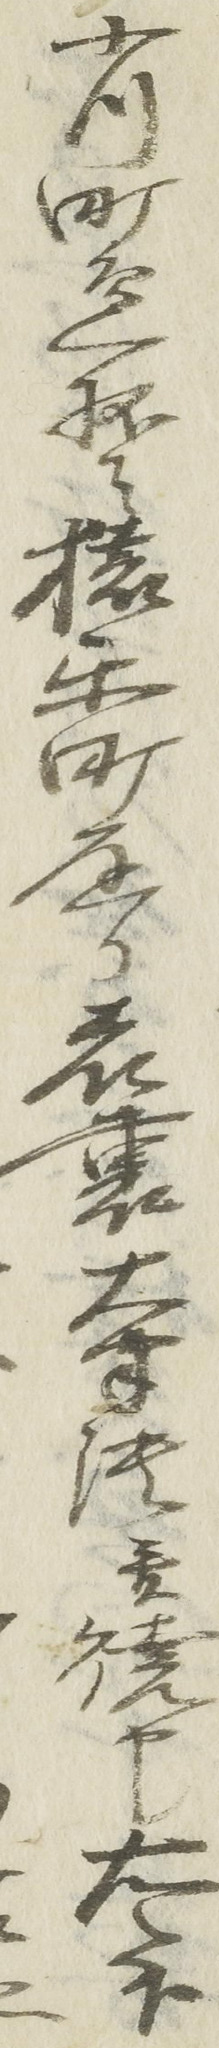小川町辺抔は猿楽町通り表裏大半潰并焼申候右之外
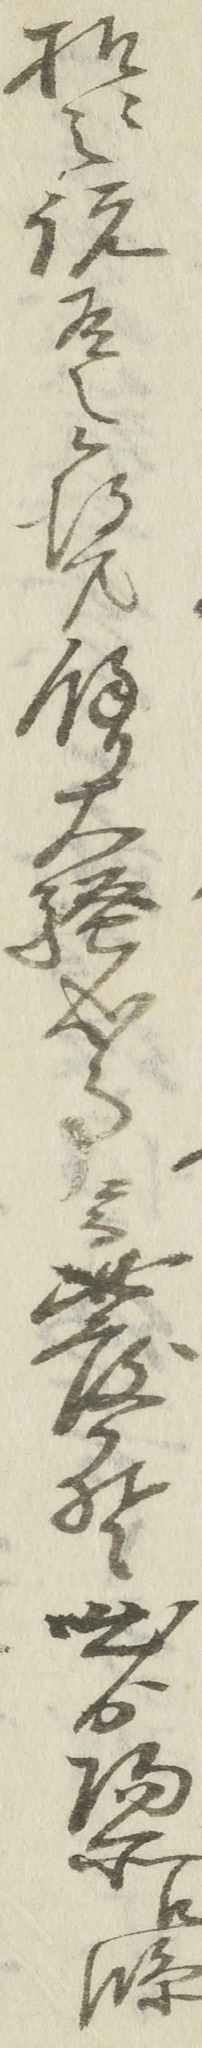様〻之説有之候得共余り大騒成事ニ而此度ケ様之咄ゟ帰所江臨
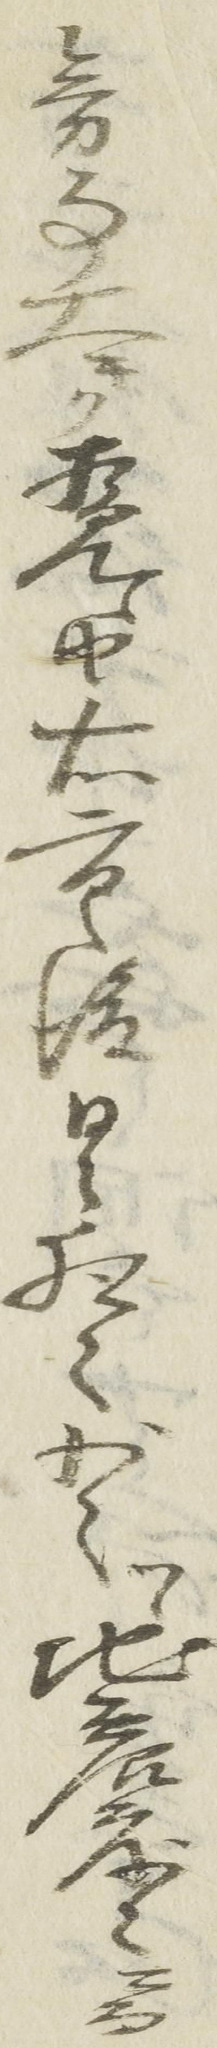候方事大キク相見候由右二日之後日〻夜〻少しツヽ地震屡〻ニ而
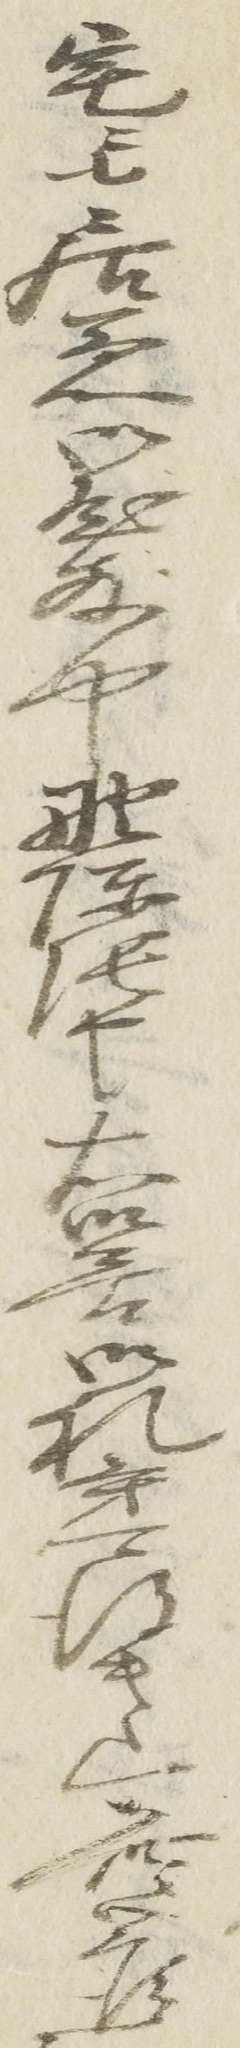宅ニも居兼御屋敷中陣張申候右御答御礼旁可得貴意無御座候
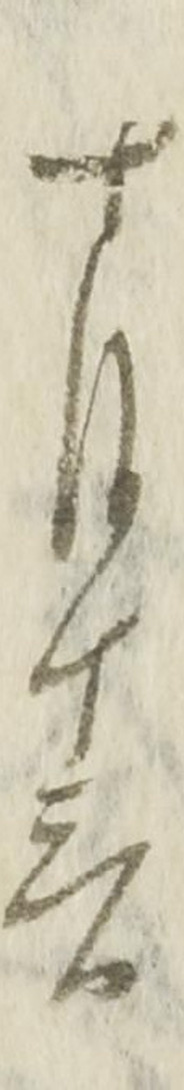十月十三日
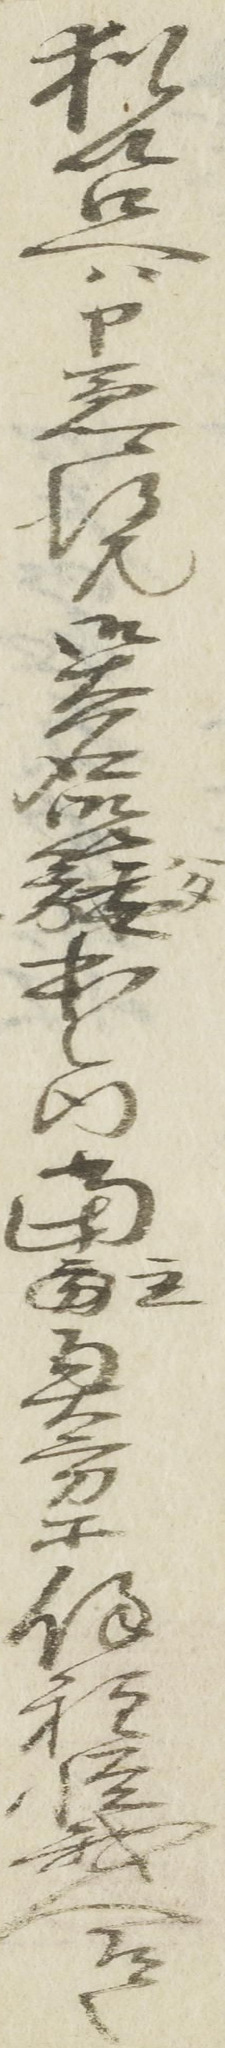猶以只ハ申兼候得共御大名御籏本之内当主奥方等余程怪我人有之
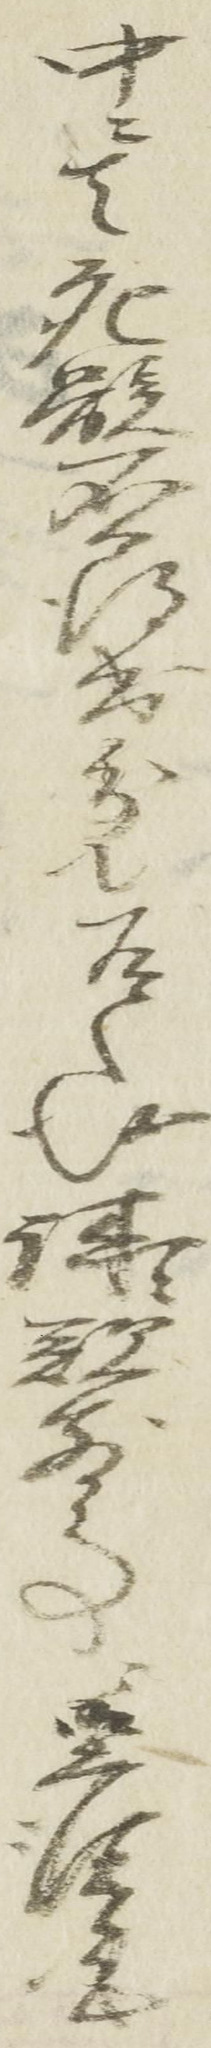中ニは死骸不被得出分も有之趣誠ニ歎敷事ニ御座候
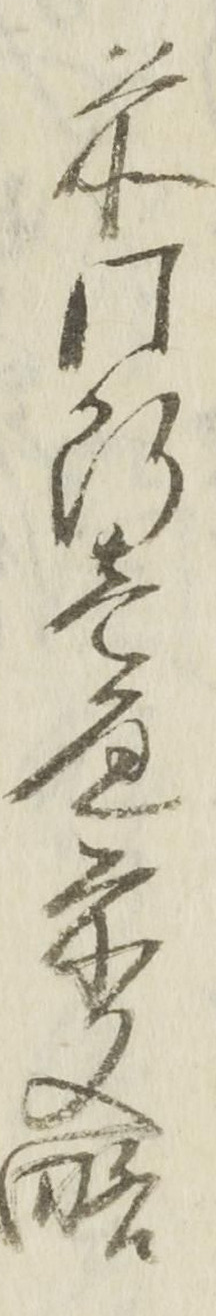前同断壱通前文略
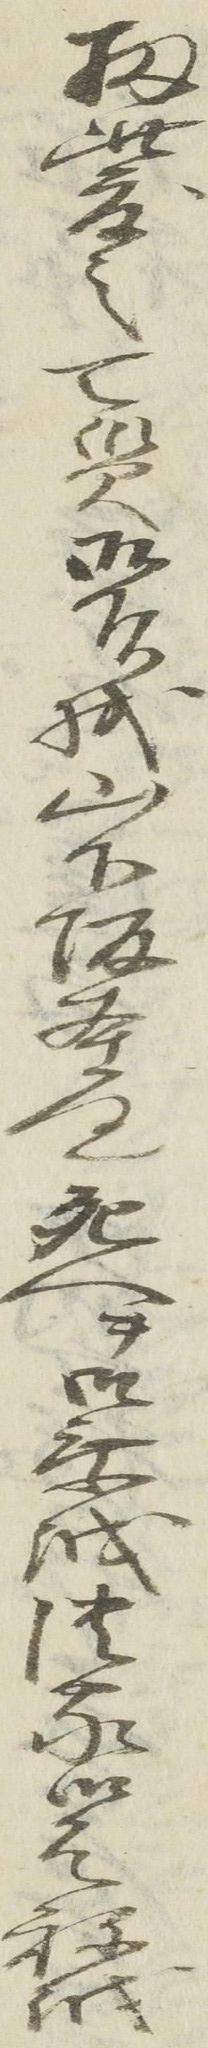扨此度之天災御山下坂本通死人ヲ御乗越潰家御そね
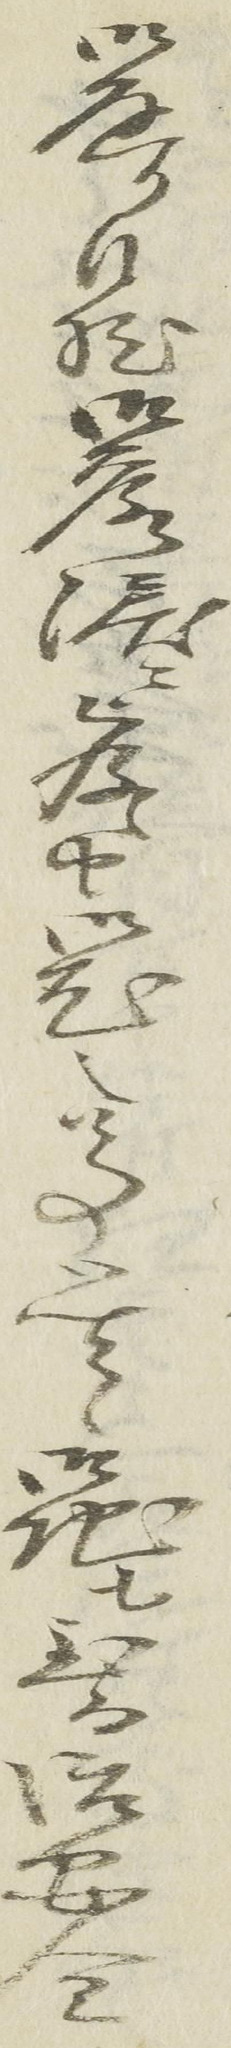御通り自然御落涙ニ被及候由御尤之御事御坐候御地も至而御安全
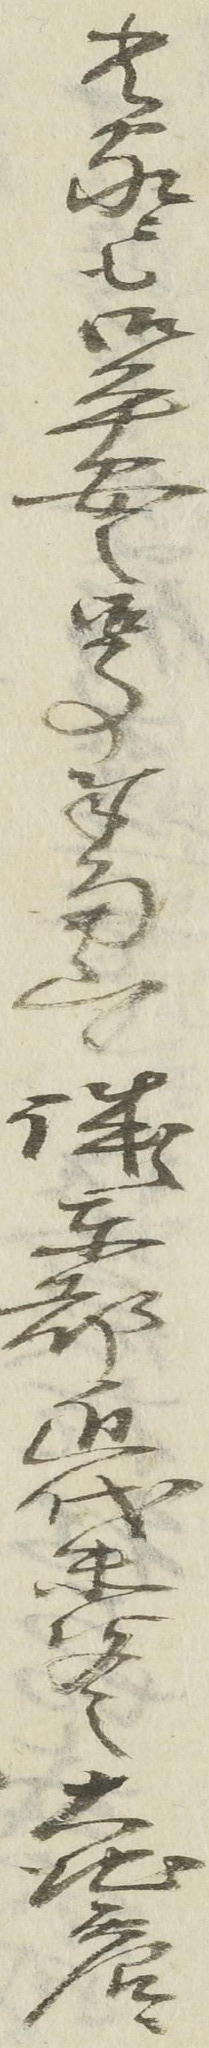貴家ニも御平安之御事奉角山候誠ニ東都近代未聞之大地震ニ
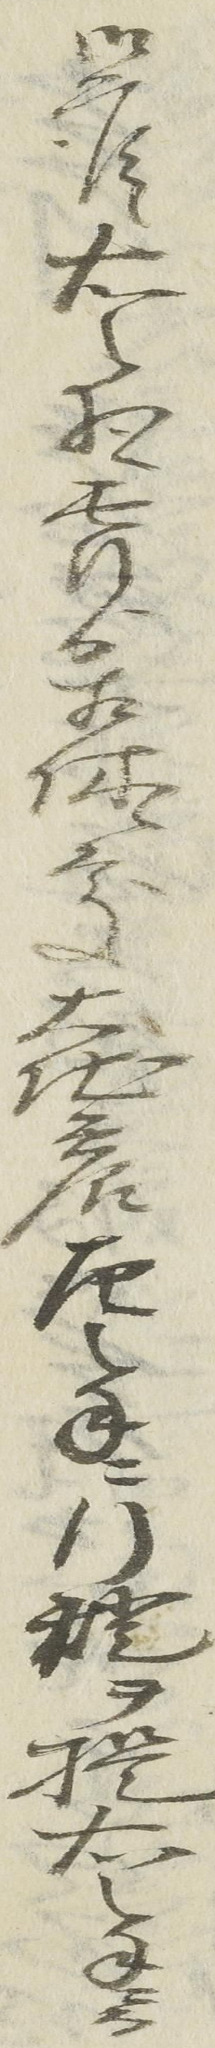御座候右之夜霄ゟ相休候処大地震左之手ニ行燈ヲ提右之手ニ而
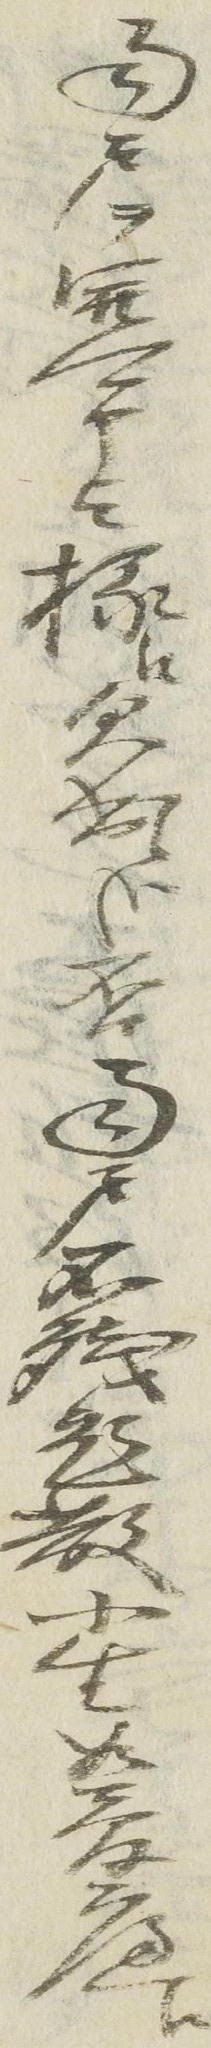雨戸ヲ開可申と椽江欠出候哉否雨戸不残飛散小生如夢庭江
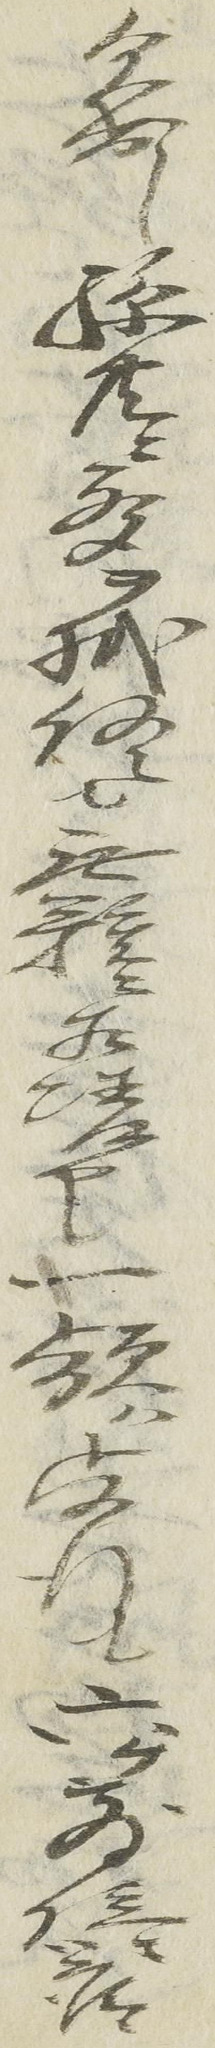欠出し孫共ニ声ヲ掛何ニも無難ニ相凌申候一頻ハ歩行も六ケ敷位ニ御座候
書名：安政乙卯江戸大地震筆記　安政丙辰八月大阪大雷雨之記追加　安政三辰年七月松前辺大地震并八月大風雨記録
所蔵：東京大学地震研究所図書室 Earthquake Research Institute Library, The University of Tokyo, JAPAN
